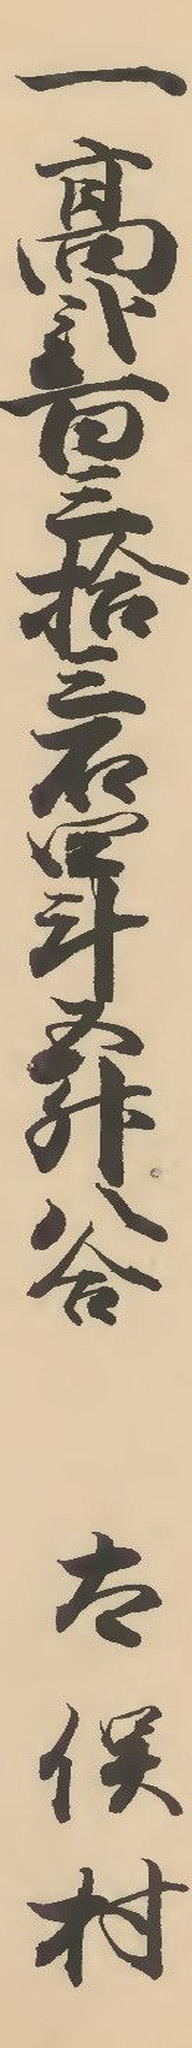一髙弐百三拾三石四斗五升八合太俣村
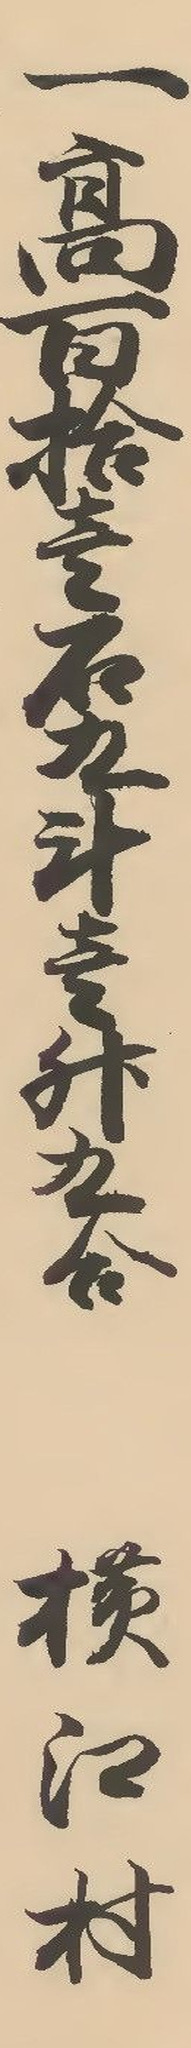一髙百拾壱石九斗壱升九合横江村

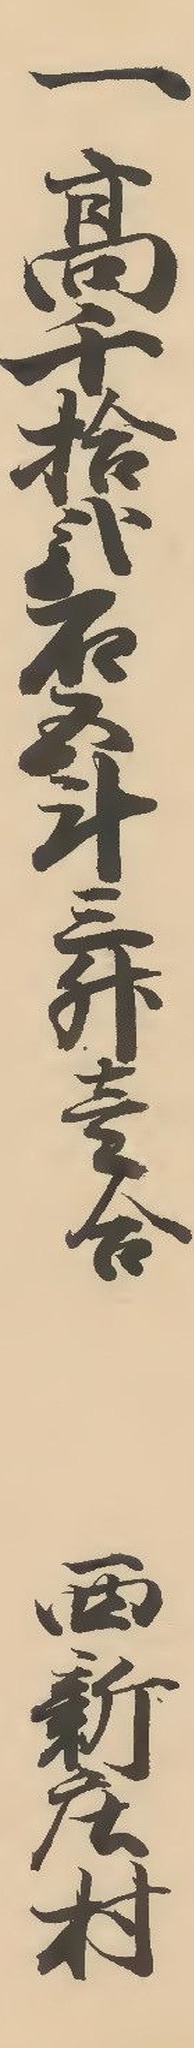一髙千拾弐石五斗三升壱合西新庄村
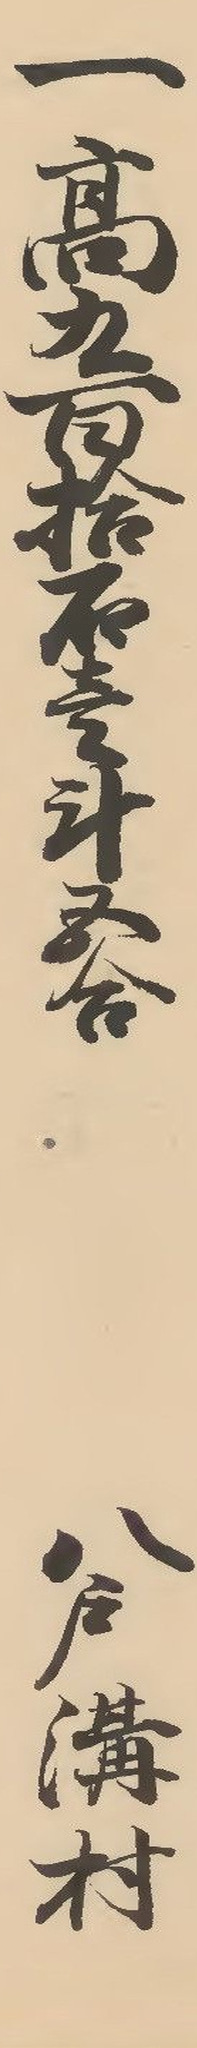一髙九百拾石壱斗五合八戸溝村
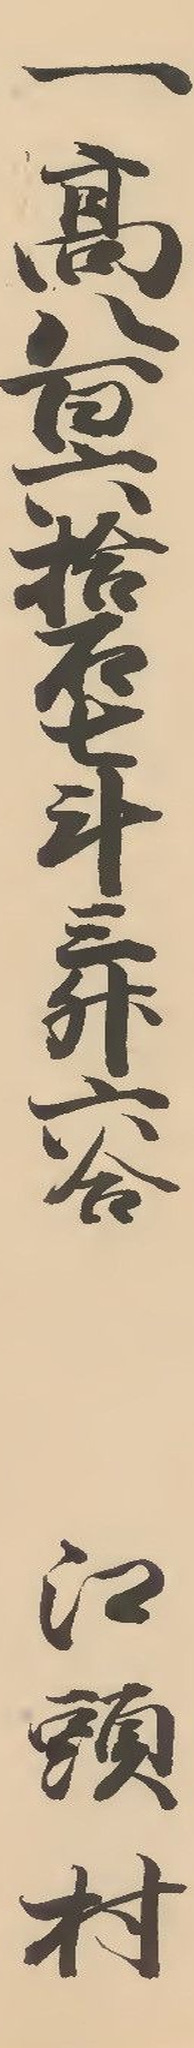一髙八百六拾石七斗三升六合江頭村
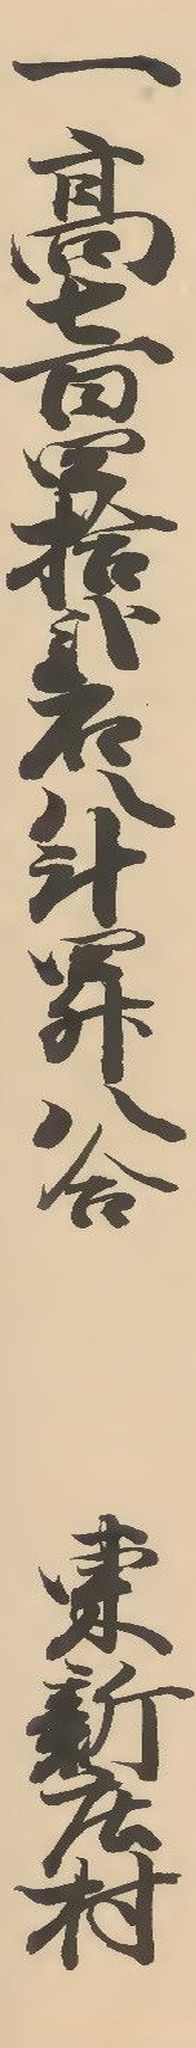一髙七百四拾弐石八斗四升八合東新庄村
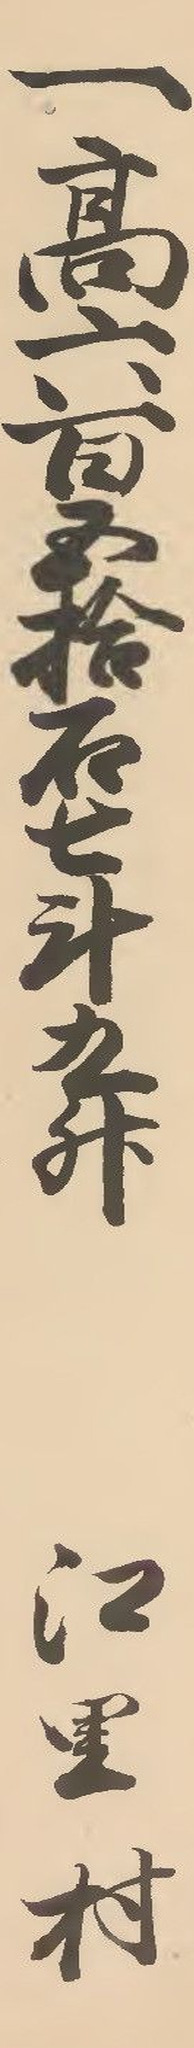一髙六百五拾石七斗九升江里村
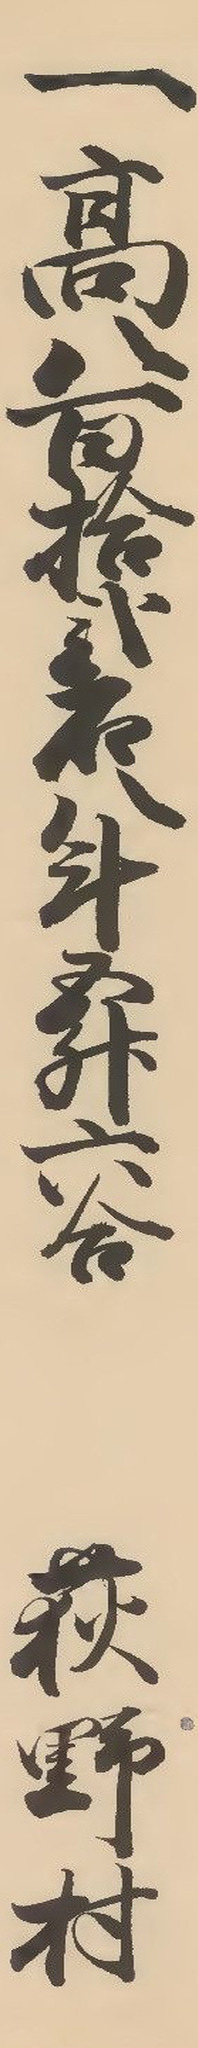一髙八百拾弐石八斗五升六合荻野村
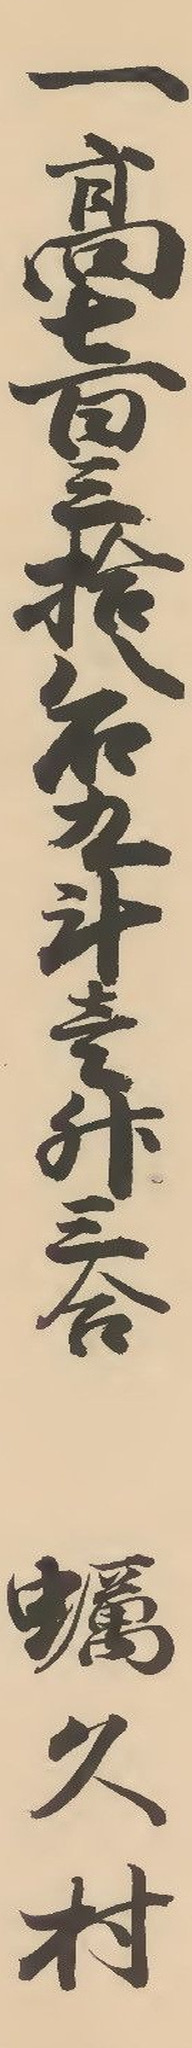一髙七百三拾八石九斗壱升三合蠣久村
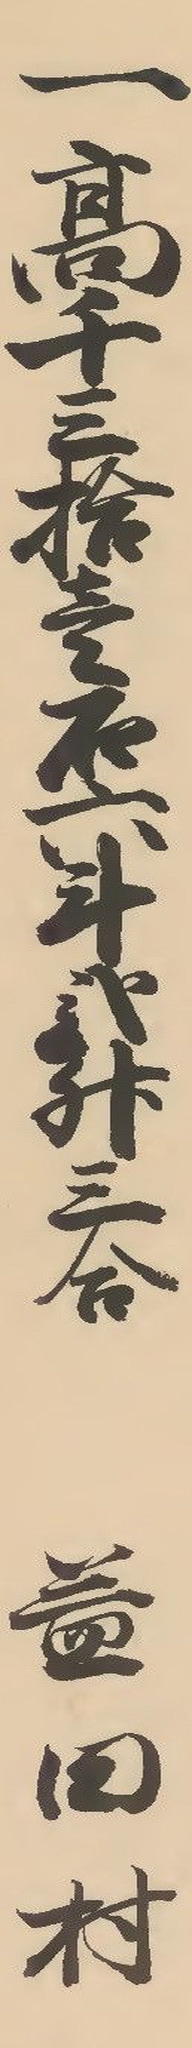一髙千三拾壱石六斗弐升三合益田村

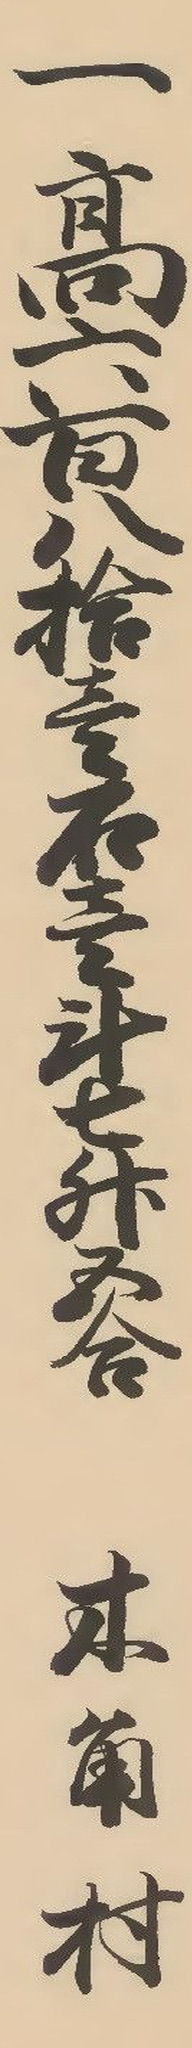一髙六百八拾壱石壱斗七升五合木角村
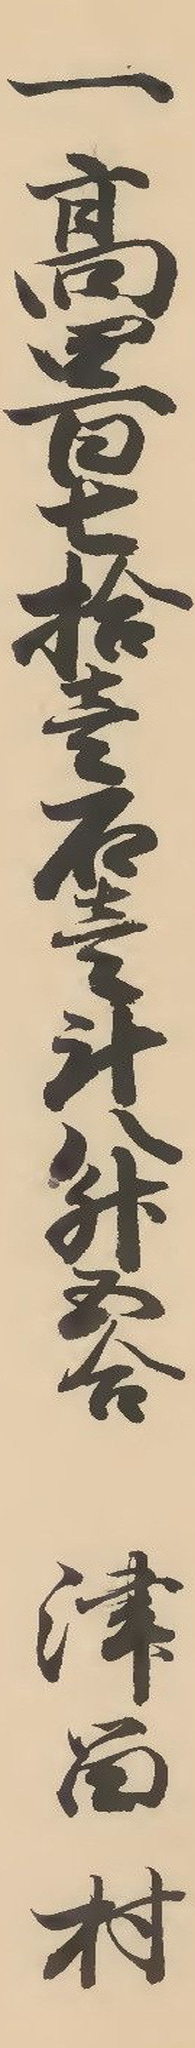一髙四百七拾壱石壱斗八升五合津留村
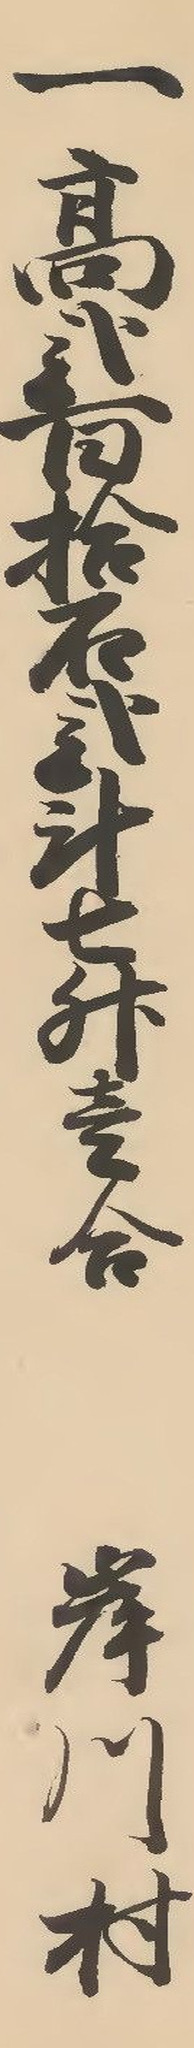一髙弐百拾石弐斗七升壱合岸川村
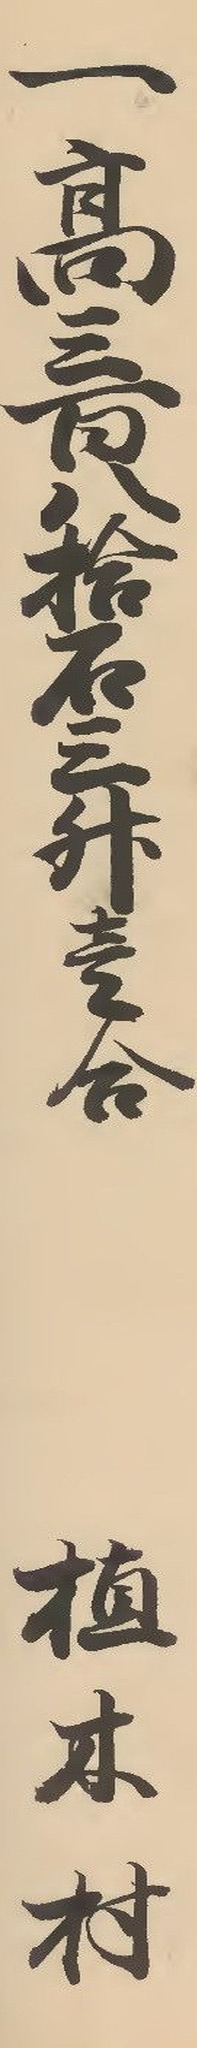一髙三百八拾石三升壱合植木村
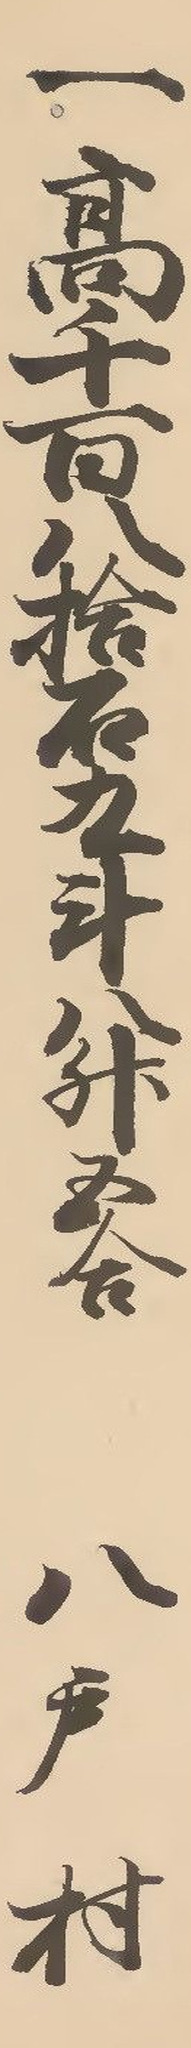一髙千百八拾石九斗八升五合八戸村
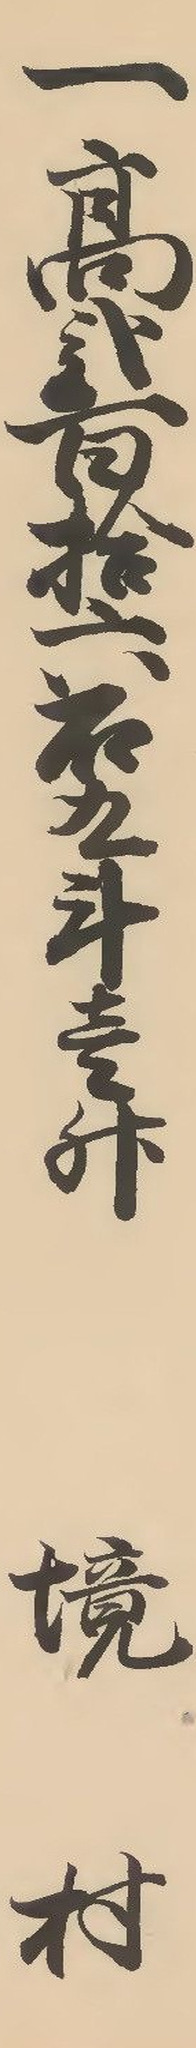一髙弐百拾六石九斗壱升堺村
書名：肥前国郷帳
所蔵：国立公文書館 National Archives of Japan
